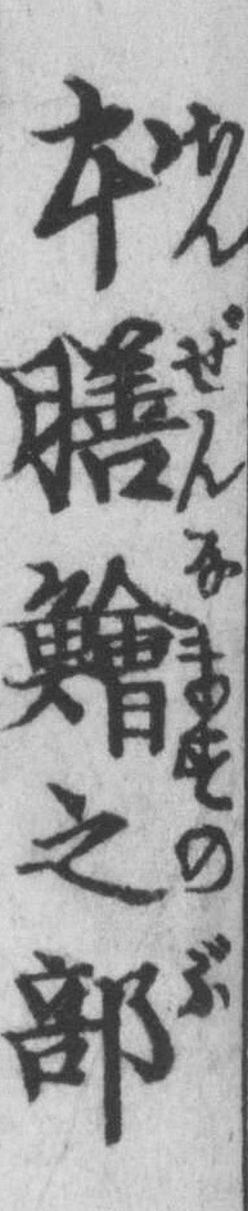本膳鱠の部

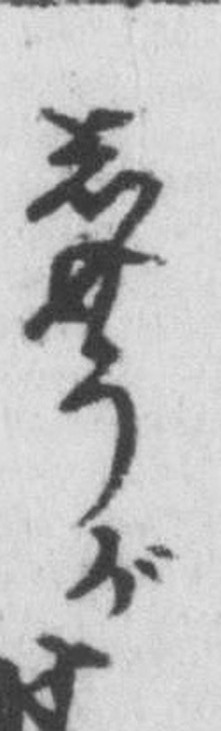しやうが
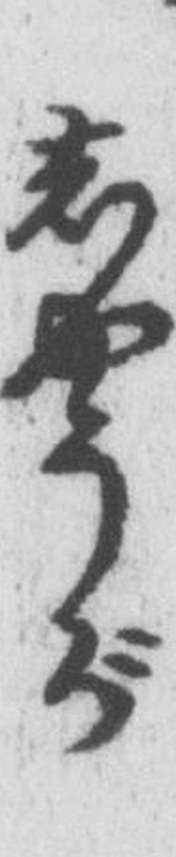しやうが
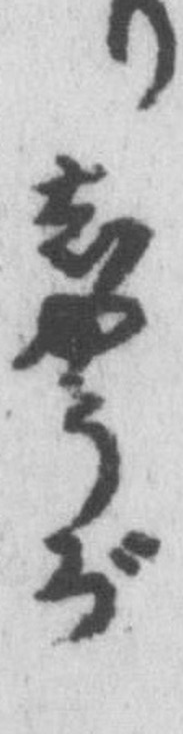しやうが
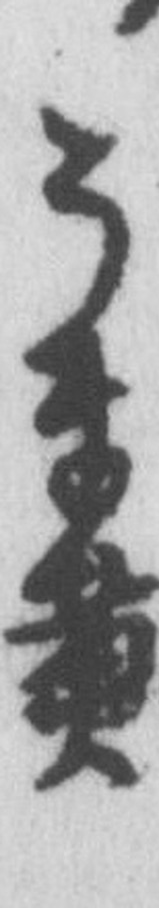うま煮
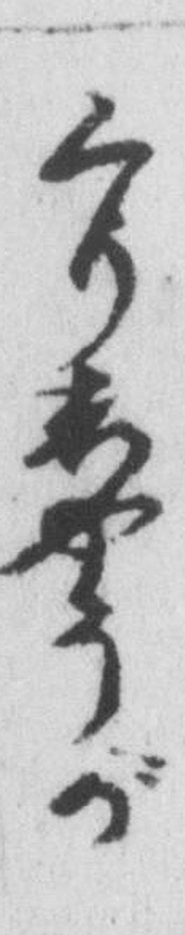ふくめしやうが
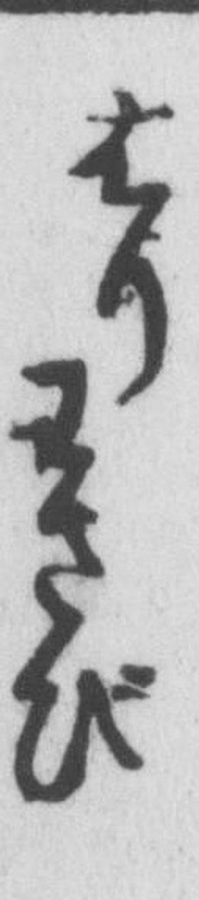はりわさび
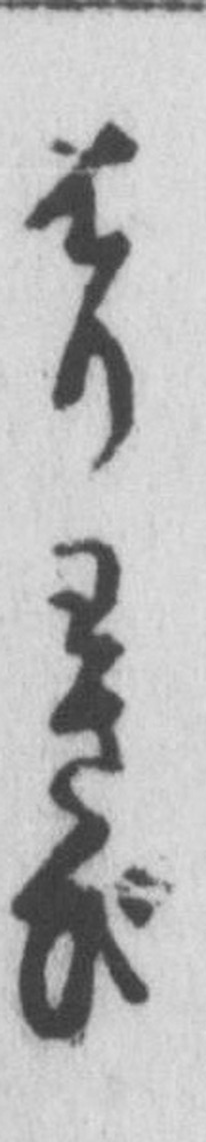はりわさび
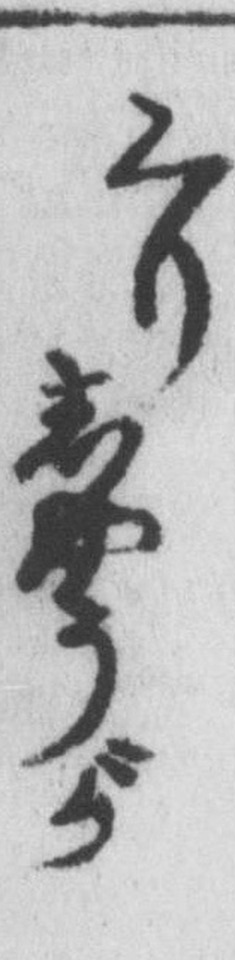しやうが
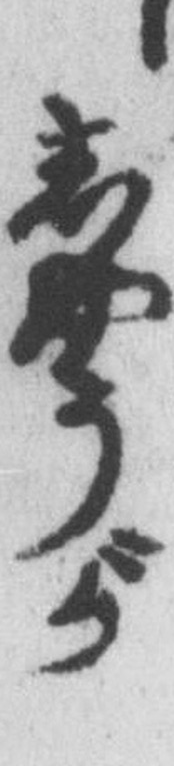しやうが
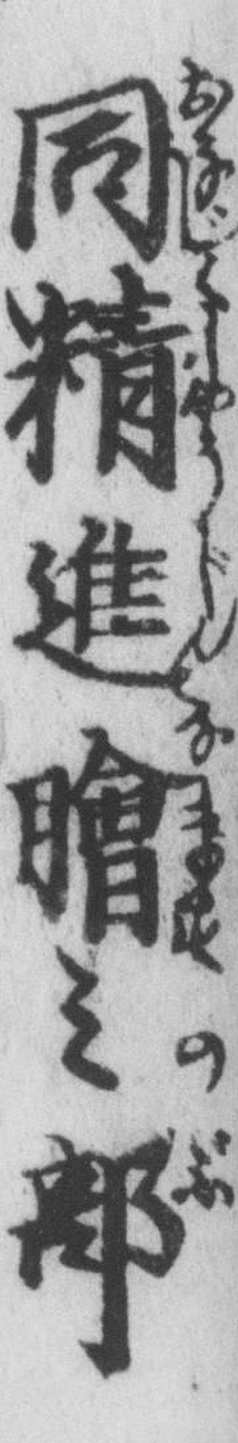同精進膾之部
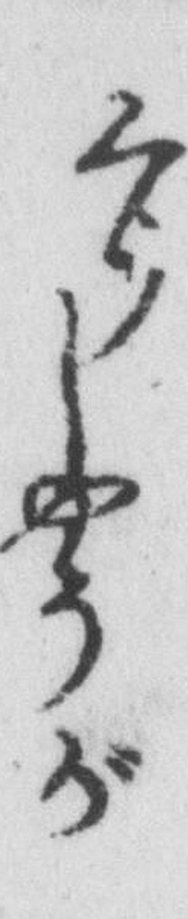ふくめしやうが
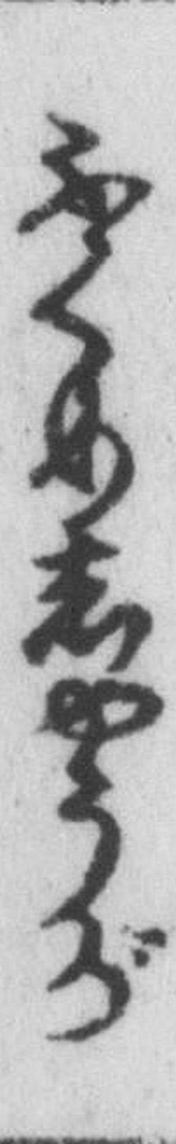ふくめしやうが
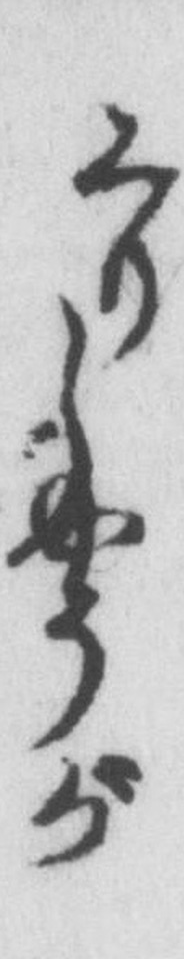ふくめしやうが
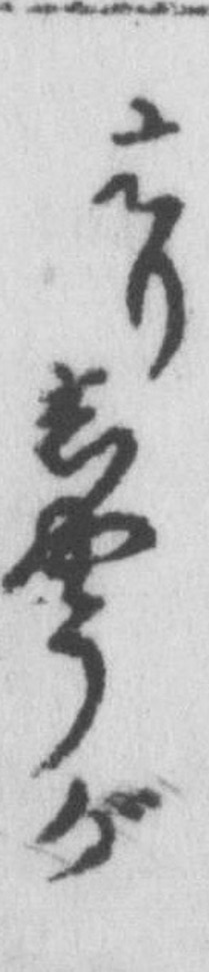しやうが
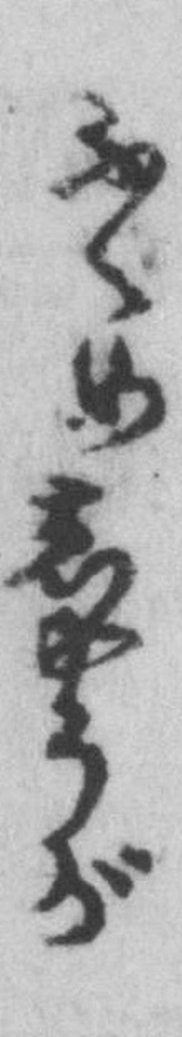ふくめしやうが
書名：当世料理献立
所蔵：大阪府立大学学術情報センター 国文学研究資料館
